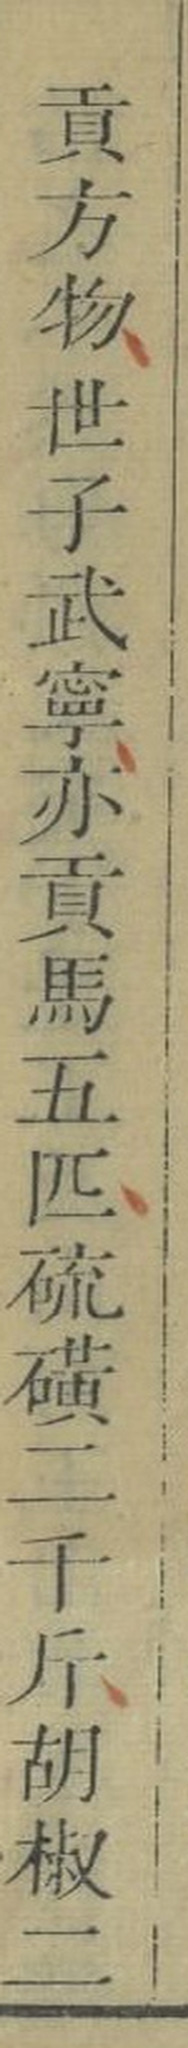貢方物世子武寧亦貢馬五匹硫磺二千斤胡椒二
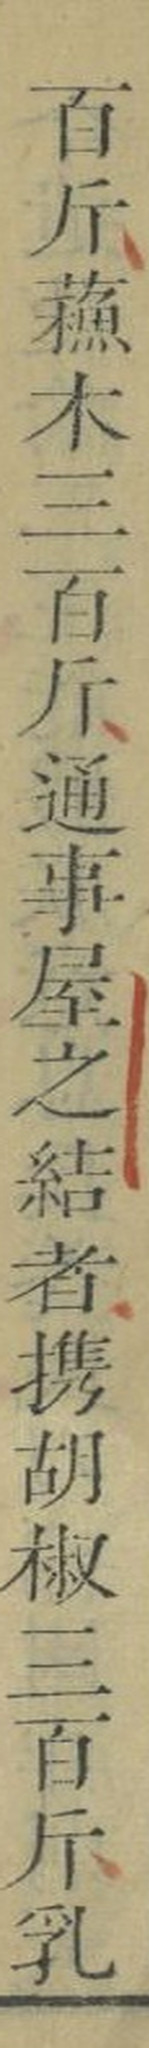百斤蘇木三百斤通事屋之結者携胡椒三百斤乳
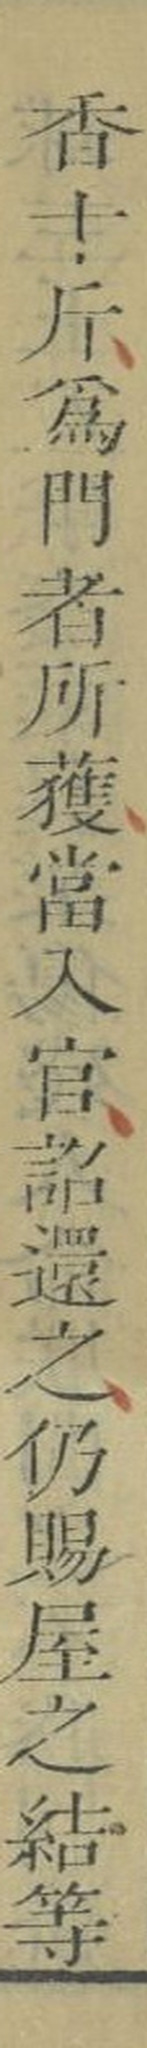香十斤為門者所獲当入官詔還之仍賜屋之結等
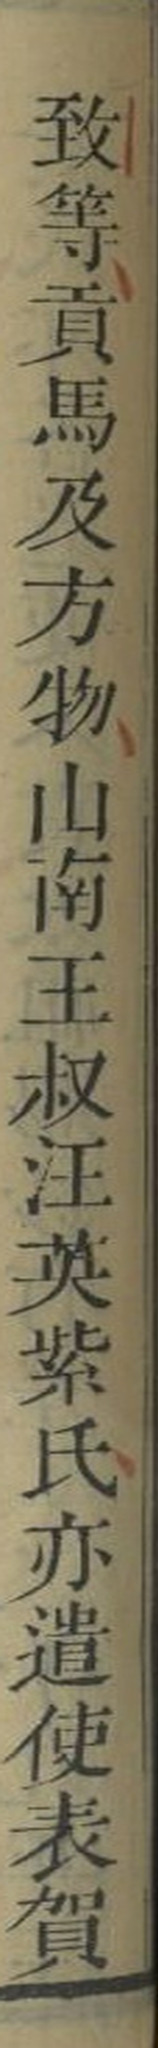致等貢馬及方物山南王叔汪英紫氏亦遣使表賀
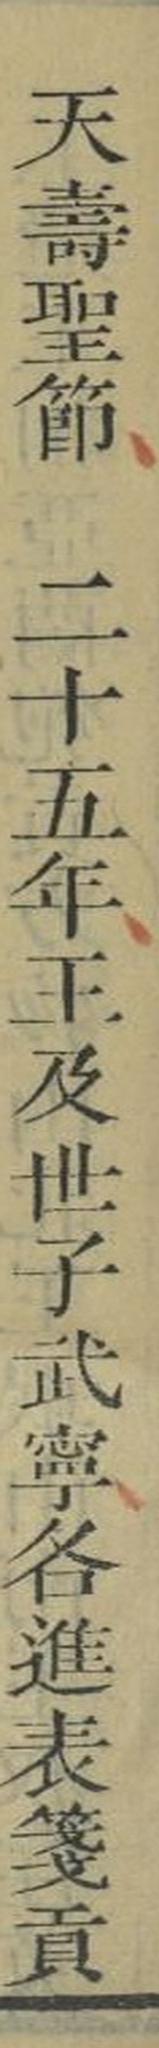天寿聖節二十五年王及世子武寧各進表箋貢
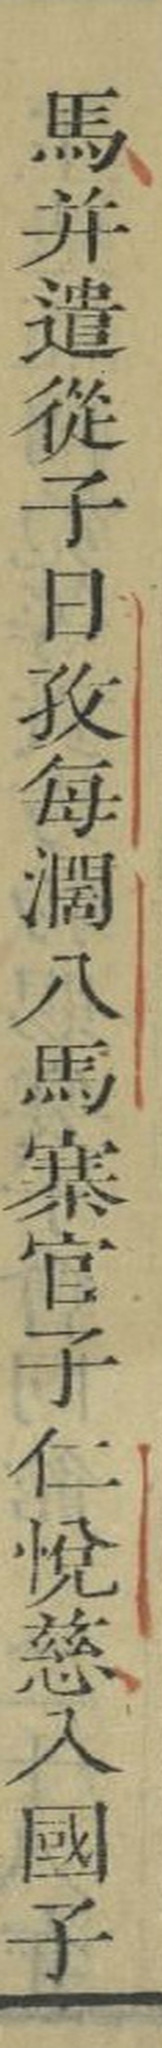馬并遣従子日孜毎濶八馬寨官子仁悦慈入国子
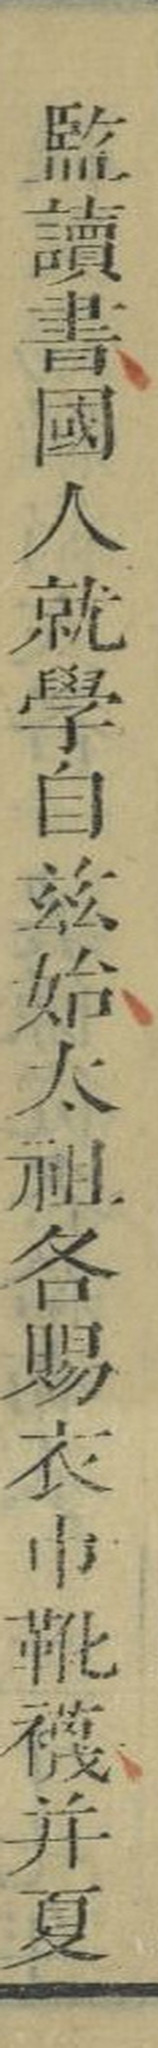監読書国人就学自茲始太祖各賜衣巾靴襪并夏
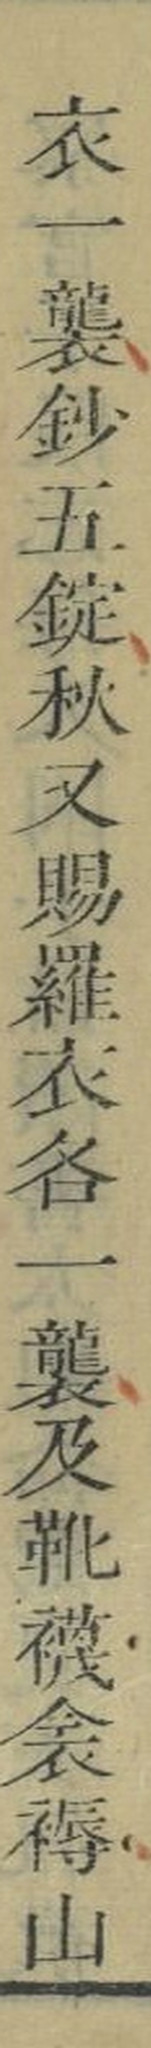衣一襲鈔五錠秋又賜羅衣各一襲及靴襪衾褥山
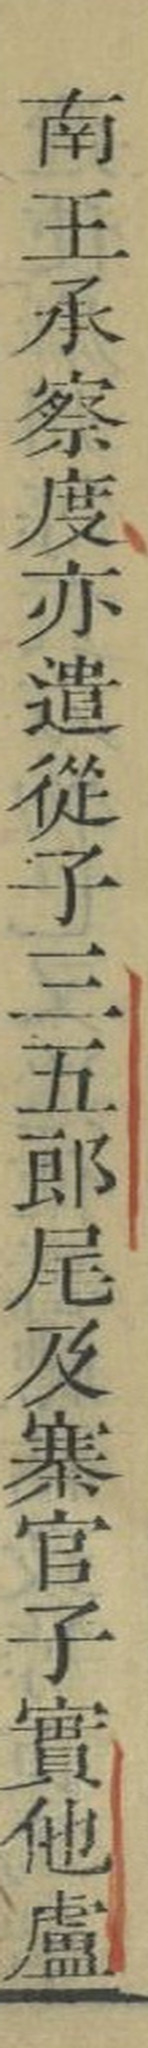南王承察度亦遣従子三五郎尾及寨官子実他盧
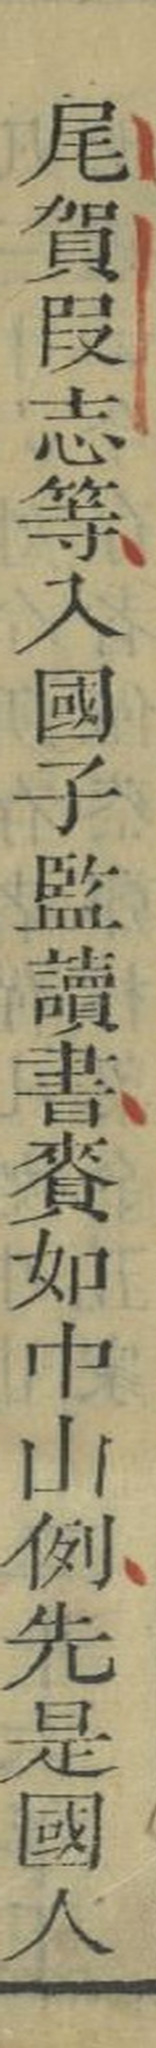尾賀叚志等入国子監読書賚如中山例先是国人
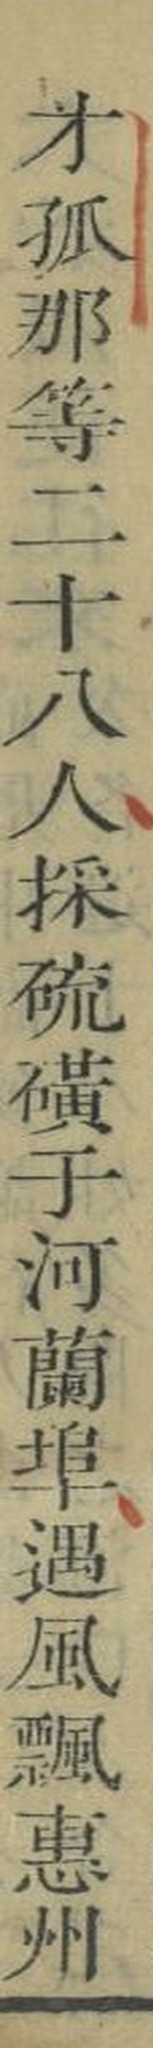才孤那等二十八人採硫磺于河蘭埠遇風飄恵州
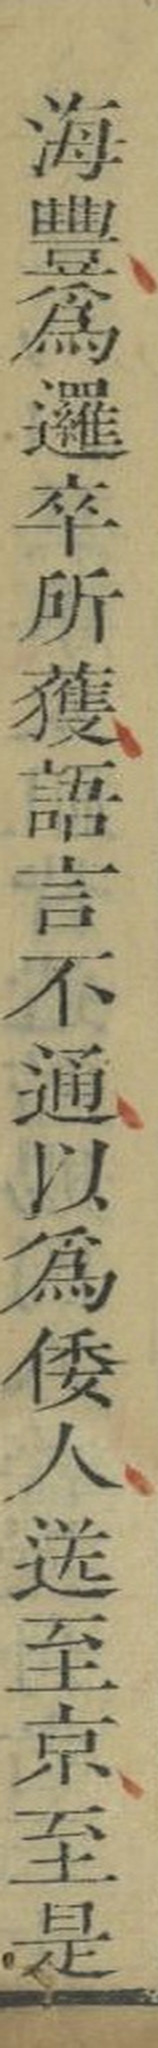海豊為邏卒所獲語言不通以為倭人送至京至是

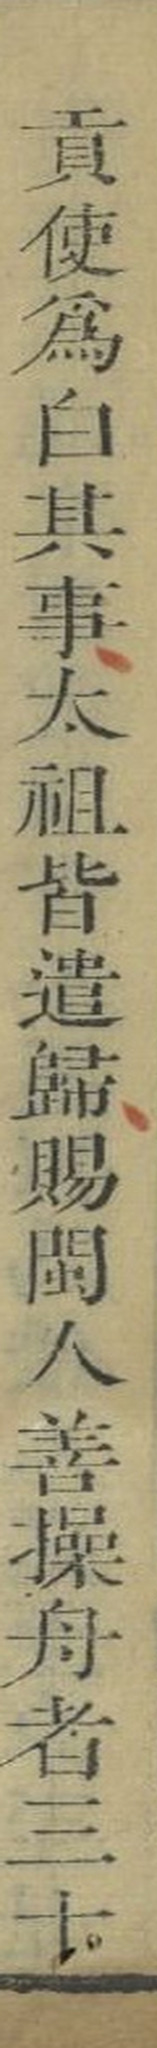貢使為白其事太祖皆遣帰賜閩人善操舟者三十
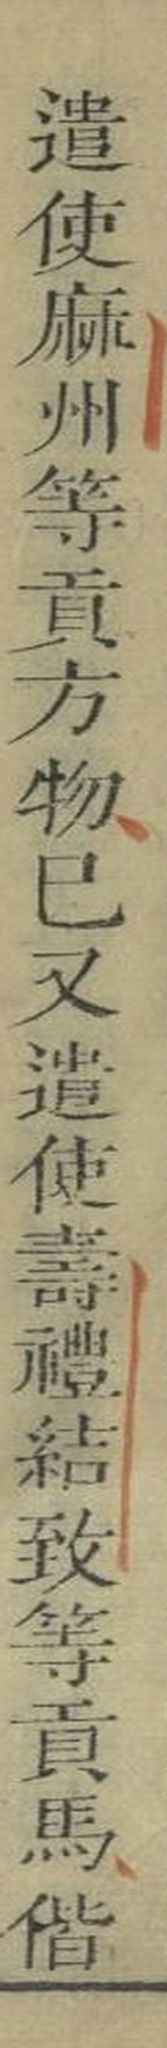遣使麻州等貢方物巳又遣使寿礼結致等貢馬偕
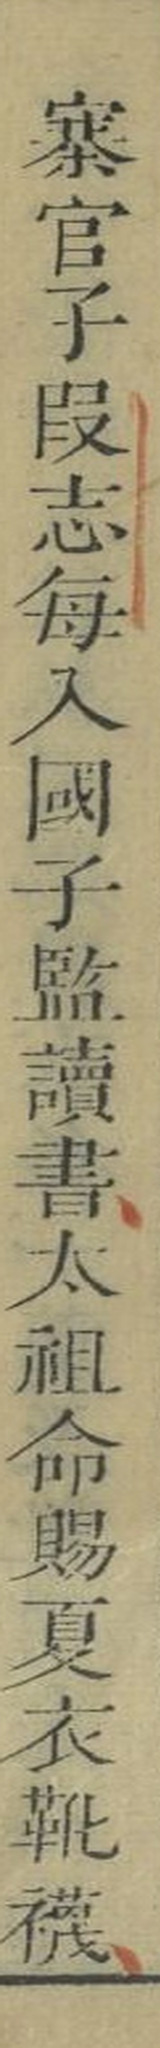寨官子叚志毎入国子監読書太祖命賜夏衣靴襪
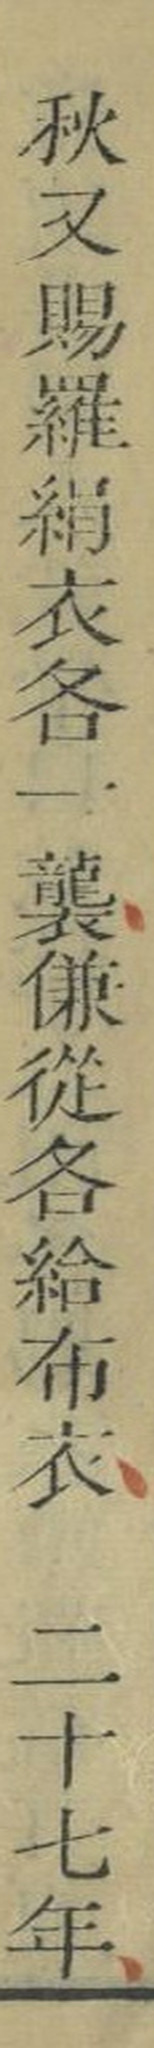秋又賜羅絹衣各一襲傔従各給布衣二十七年
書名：中山伝信録 巻三
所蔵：University of the Ryukyus Library
